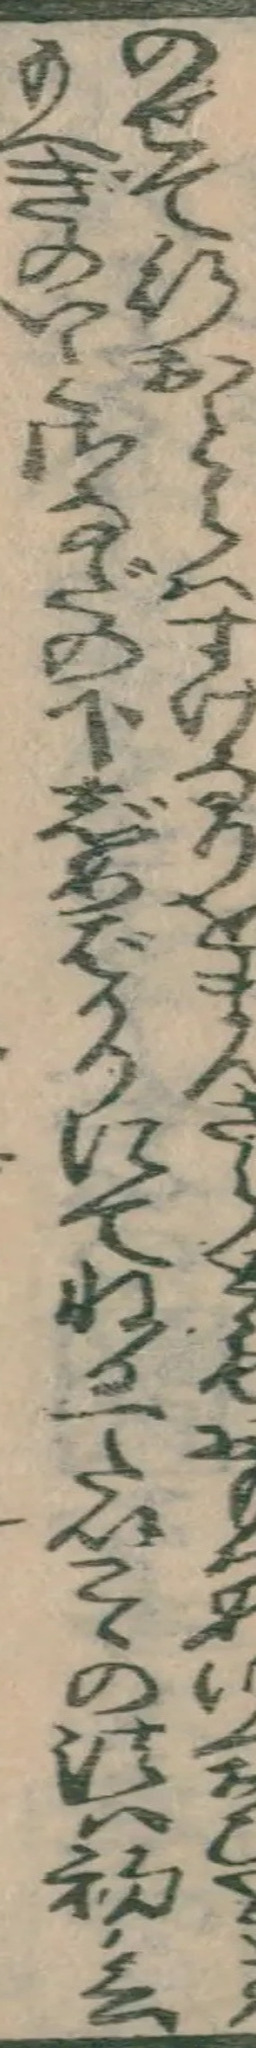もへぎのいとさなだの下じめばかりにてねる一たいこゝの法は初会
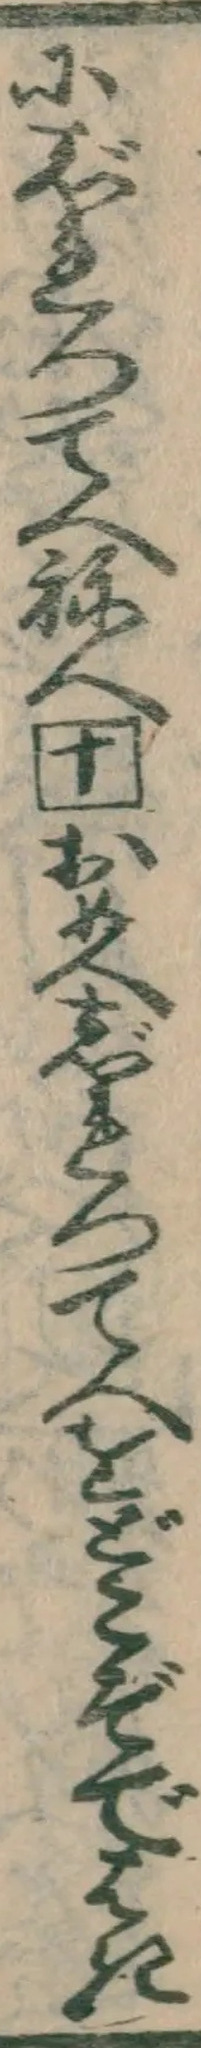にじれつてへねへ〈十〉おめへじれつてへをどこぞではき
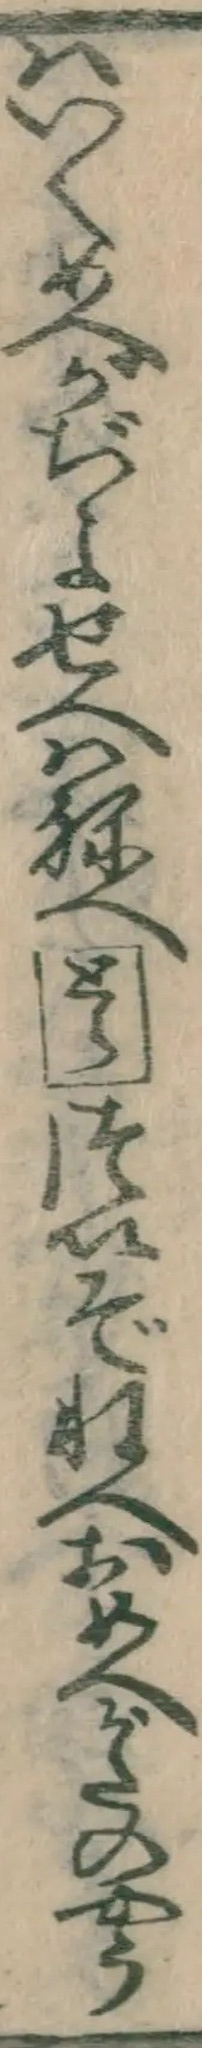はいくめへがぢよせへはねへ〈とら〉ついぞねへおめへがたのやう

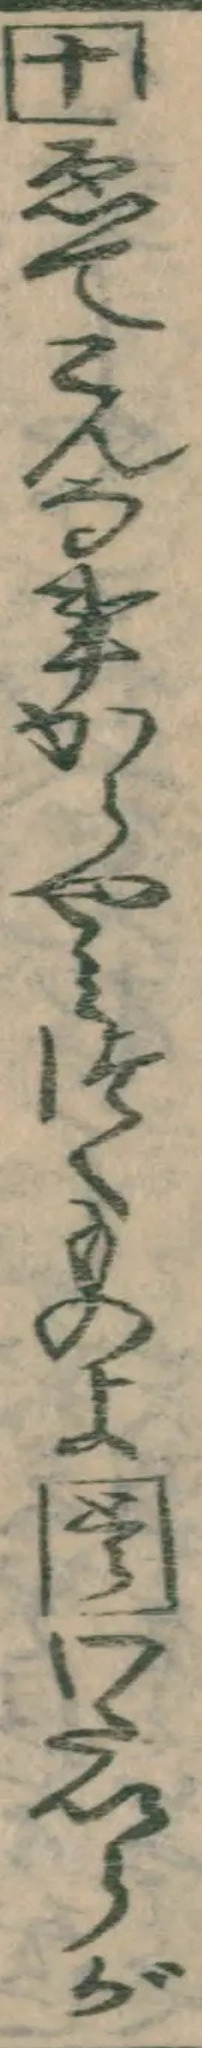〈十〉ゑてこんな事からやみつくものよ〈とら〉わたいらが
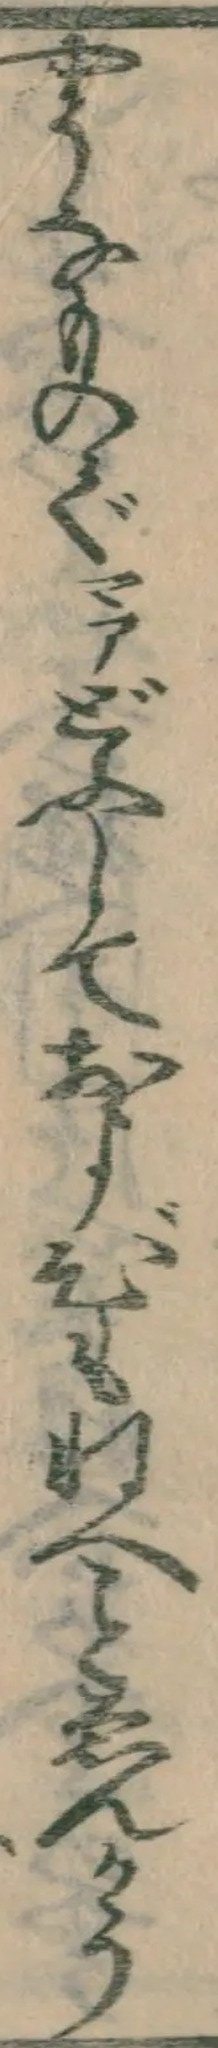やうなものでマアどふしておよびもねへことゑんかう
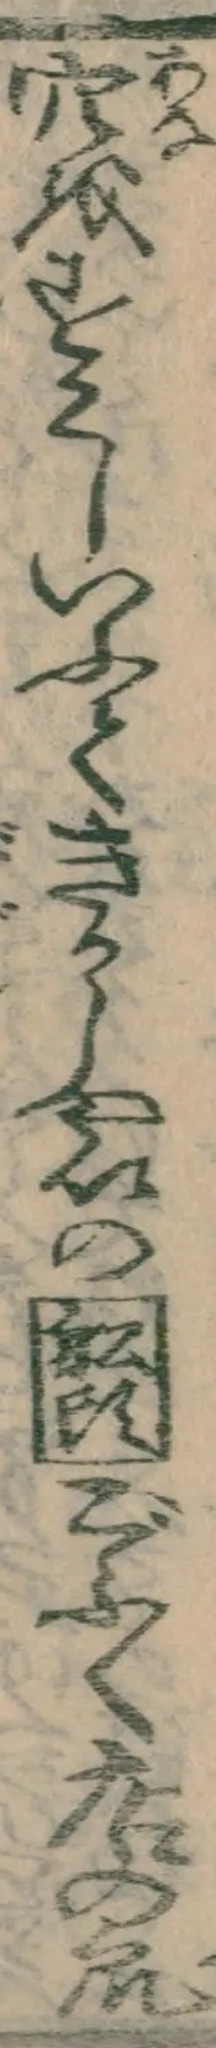穴をすこしいふてきかしやいの〈船頭〉しごふく店の衆
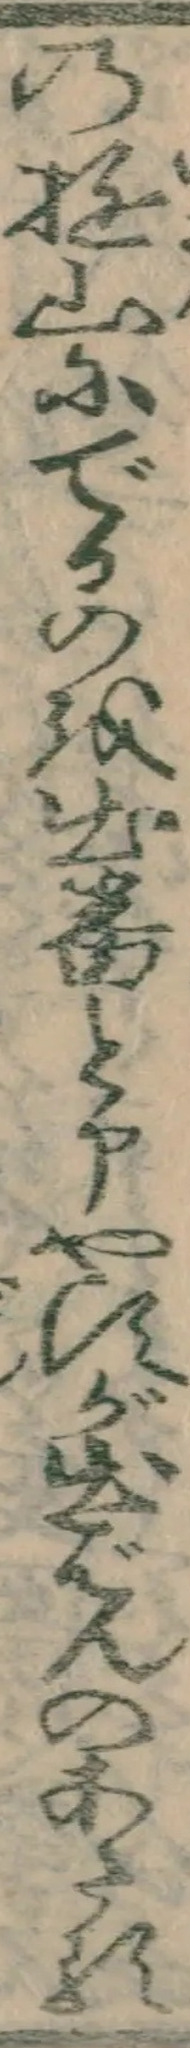の遊山にでるのを出番と申やすが出ばんのあさる
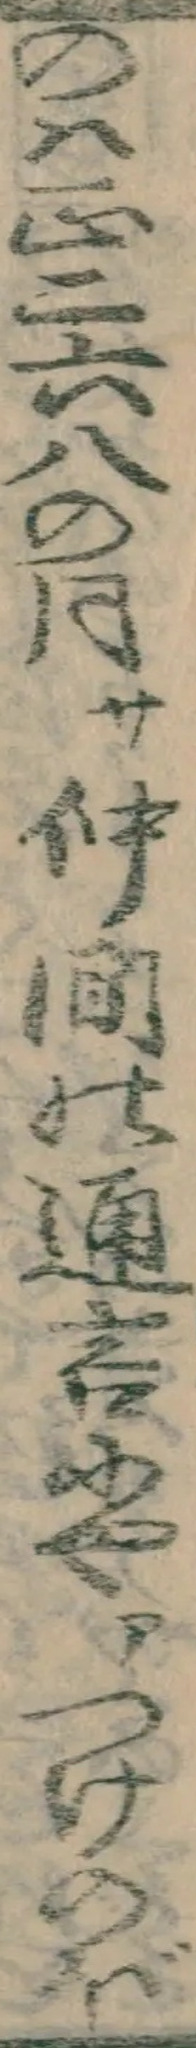のは正二六八の月サ仲間の通言にやァつけのぼ
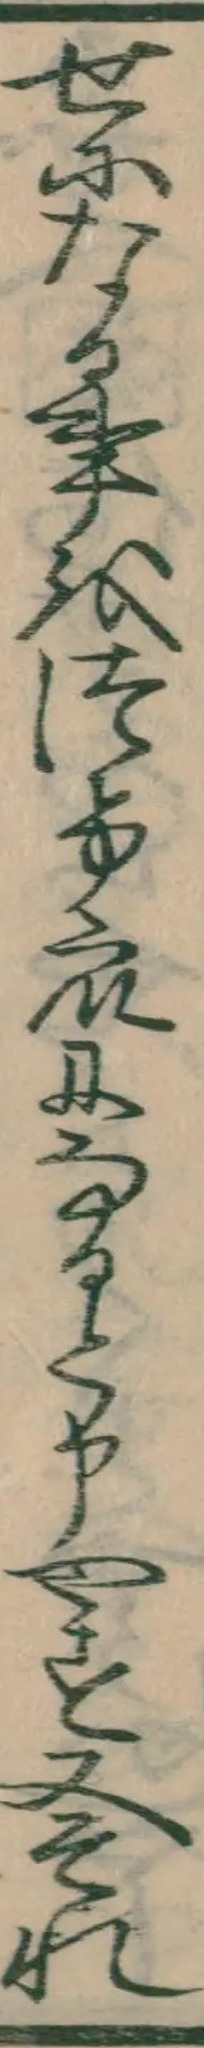せになる事をつけ衆になると申やす又それ
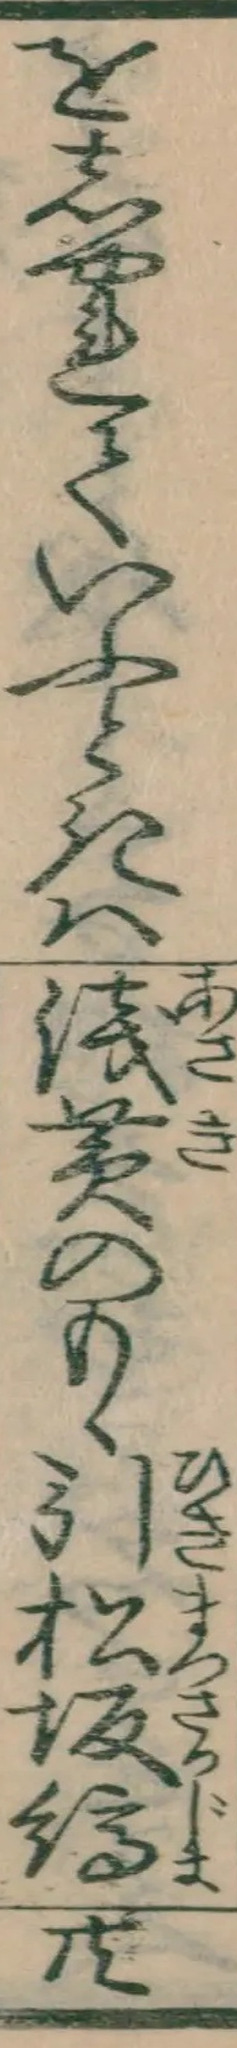をしやれていふときは〈浅黄のもゝ引松坂縞〉共
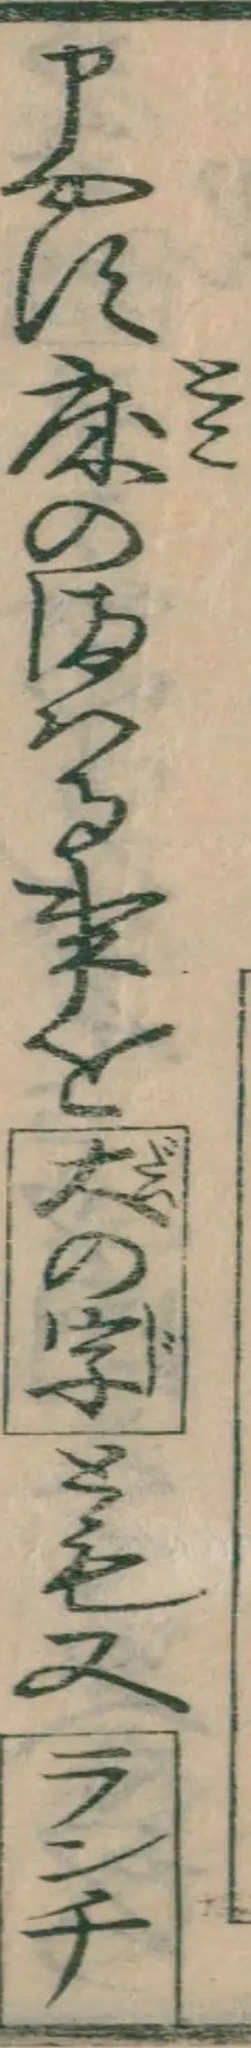申やす床のまはる事を〈大の字〉とも又〈ランチ
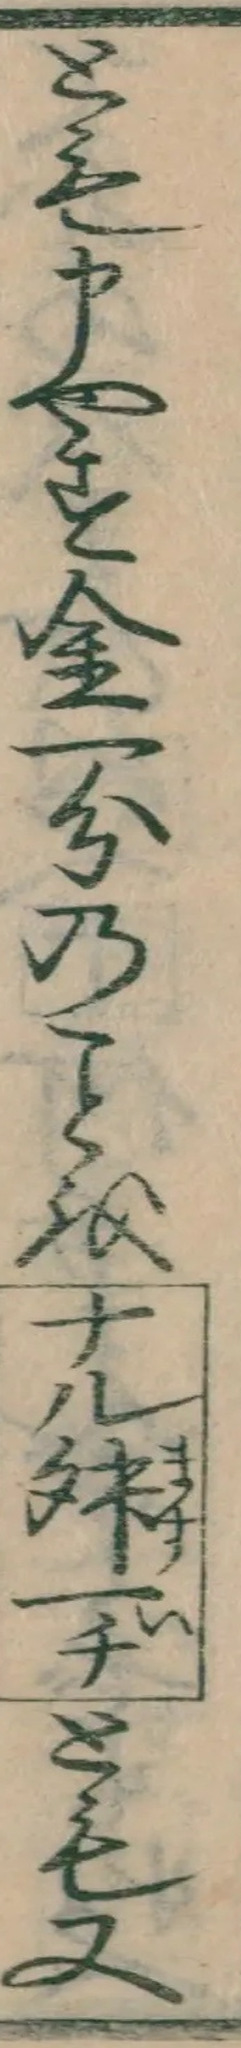とも申やす金一分のことをナル升一千とも又
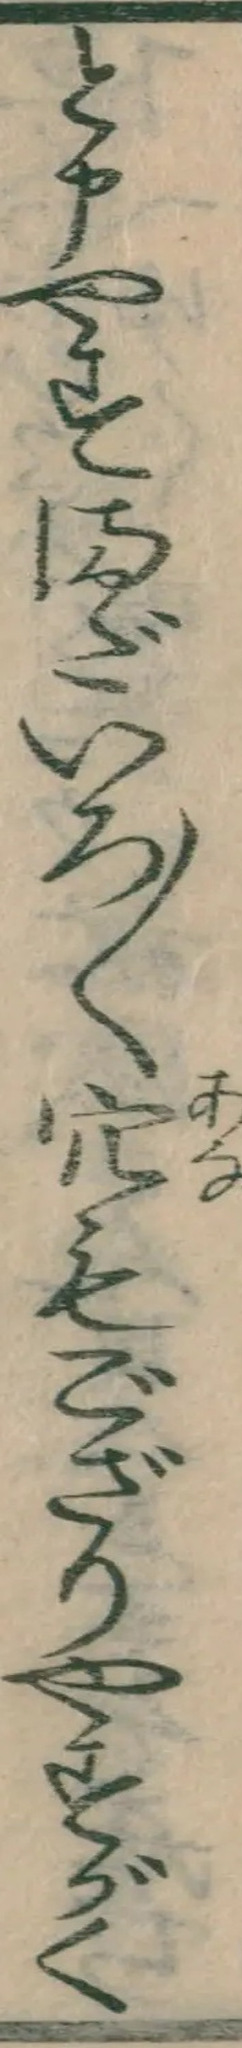と申やすまだいろ〳〵穴もござりやすがく
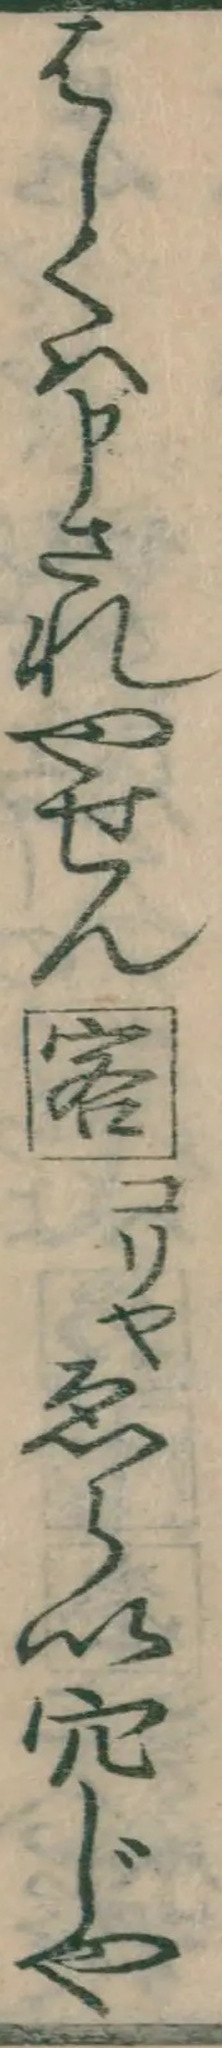はしくは申されやせん〈客〉コリヤゑらい穴じや

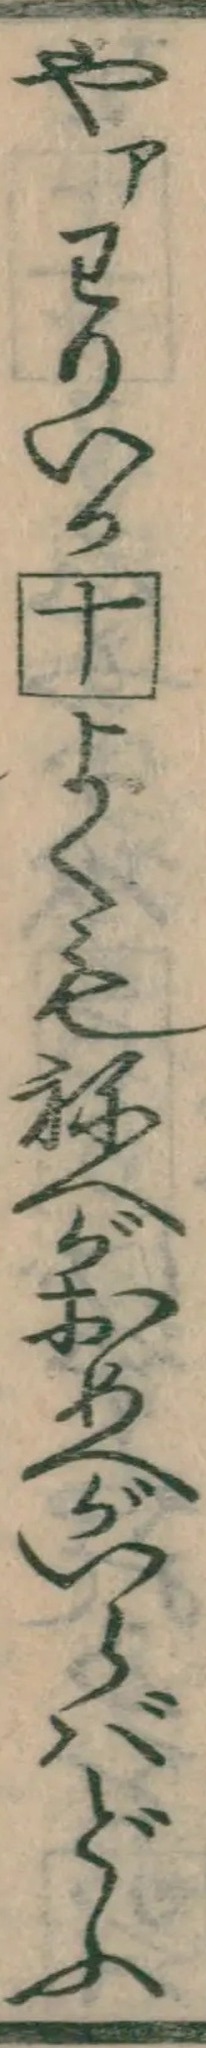やァわりいか〈十〉よくもねへがおめへがいらばどふ
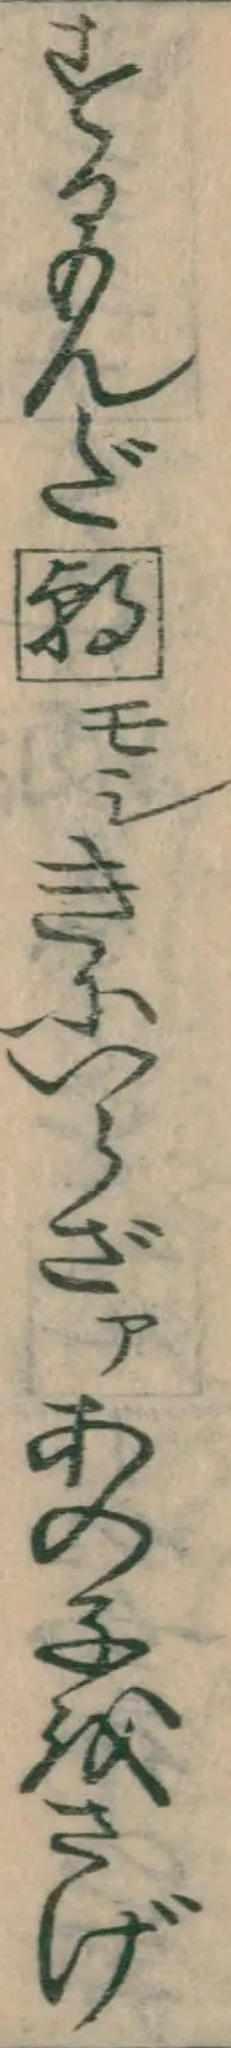するもんだ〈朝〉モシきにいらざァあの子をさげ
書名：教訓読本：大礒風俗仕懸文庫
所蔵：国立国会図書館 National Diet Library, JAPAN
